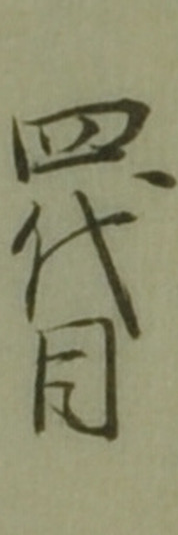四代目
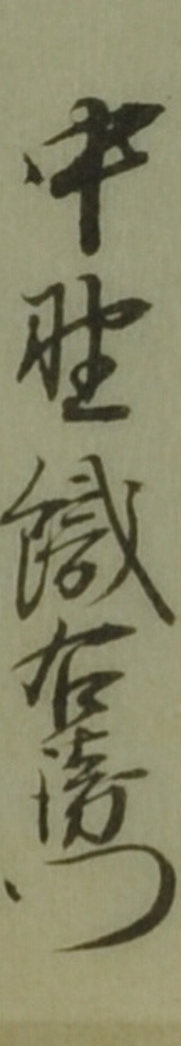中野織右衛門
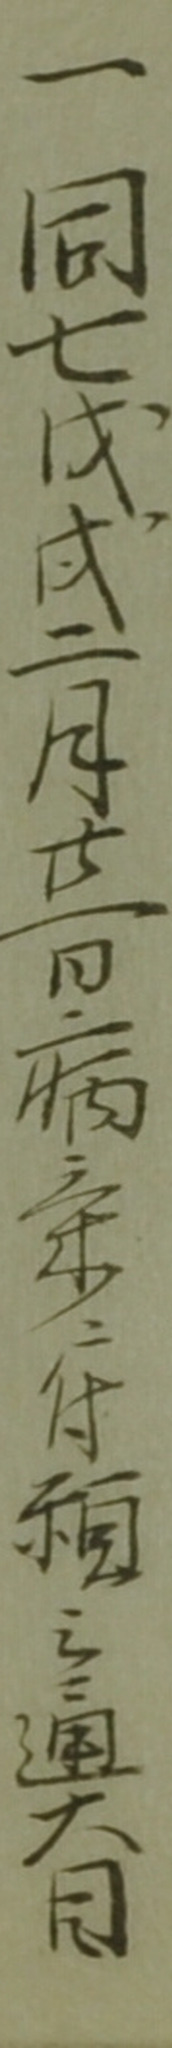一同七戊戌二月廿一日病気付願之通大目
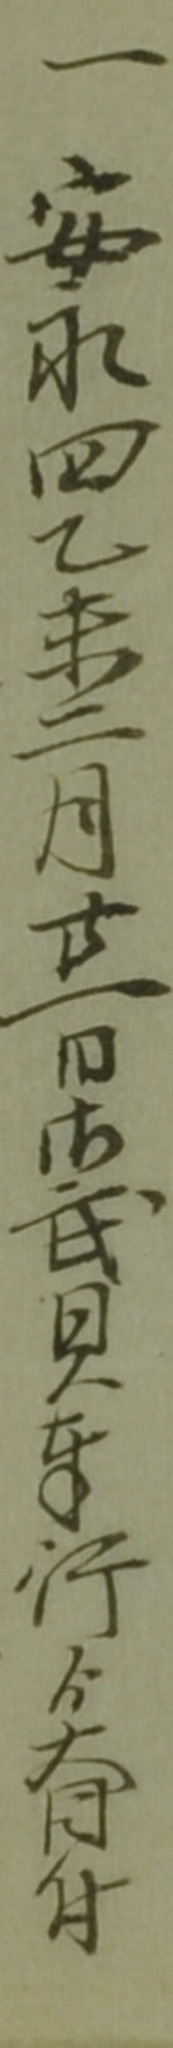一安永四乙未二月廿一日御武具奉行ゟ大目付
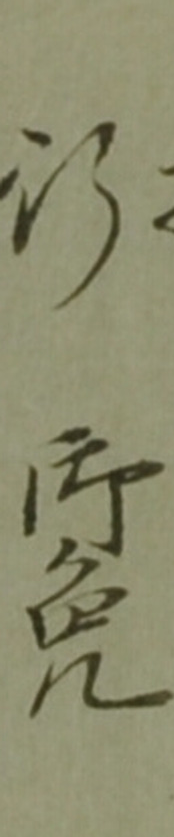行御免
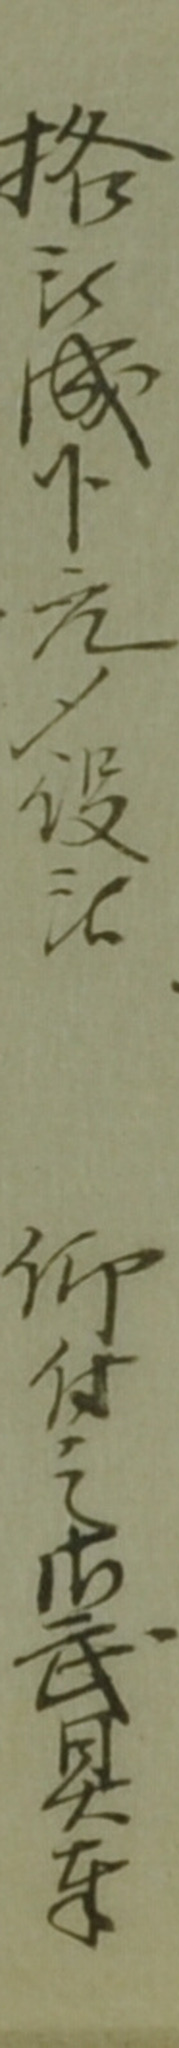格被成下元〆役被仰付之御武具奉
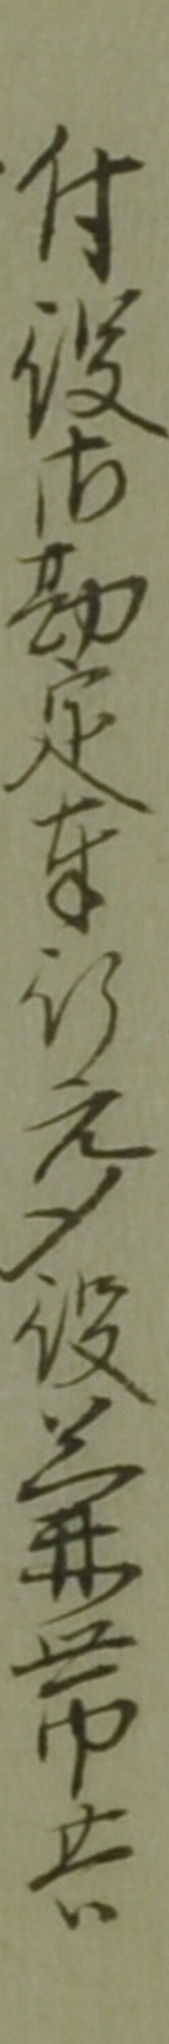付役御勘定奉行元〆役兼帯共
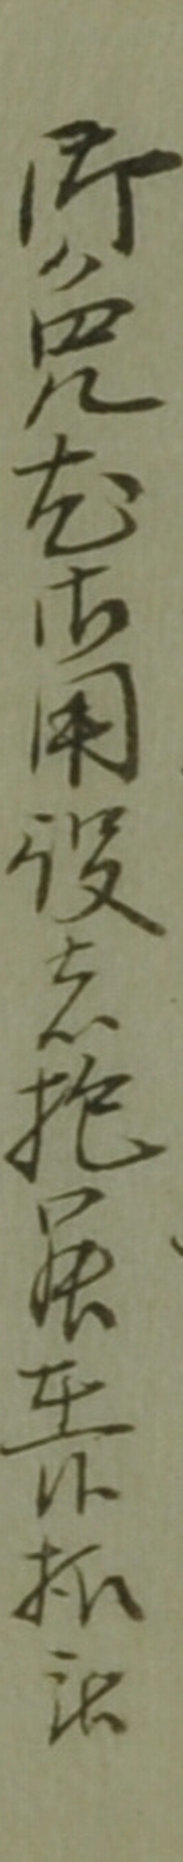御免尤御用役者抱御座在候様被
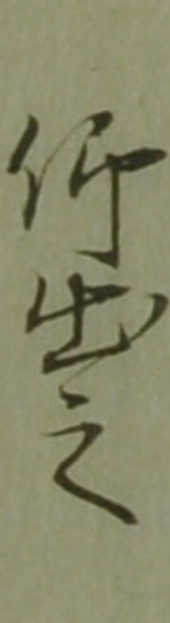仰出之
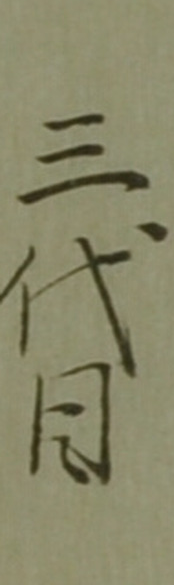三代目
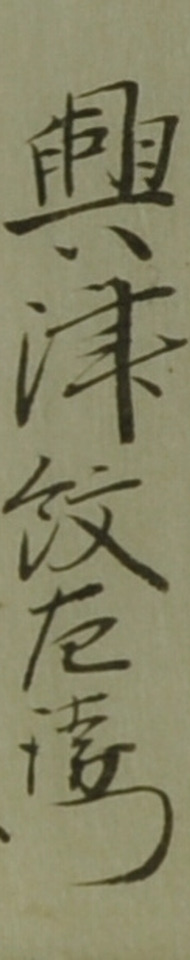興津紋左衛門
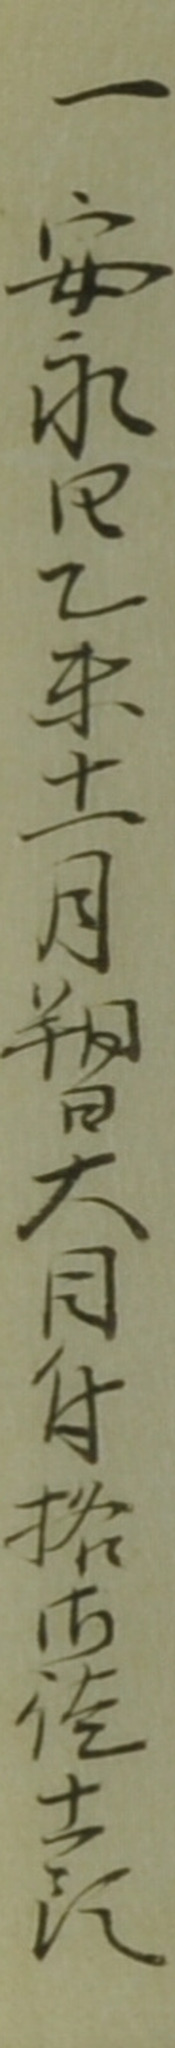一安永四乙未十一月朔日大目付格御徒士頭

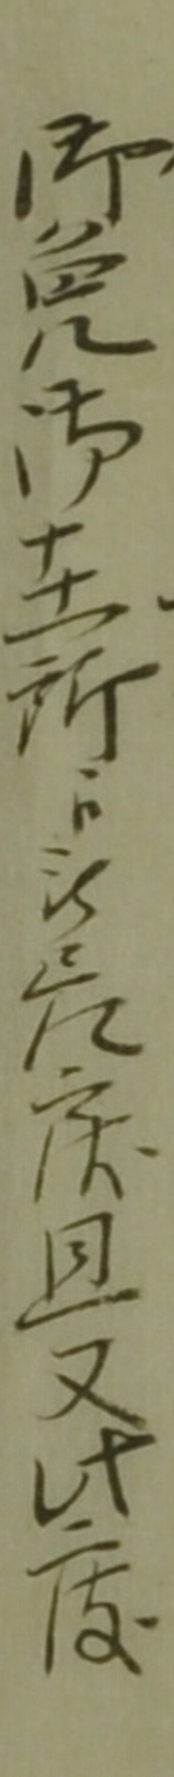御免御在所江被差戻且又此度
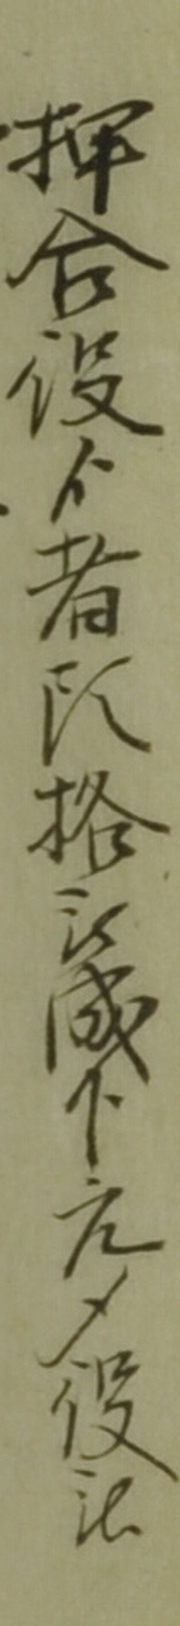押合役ゟ者頭格被成下元〆役被
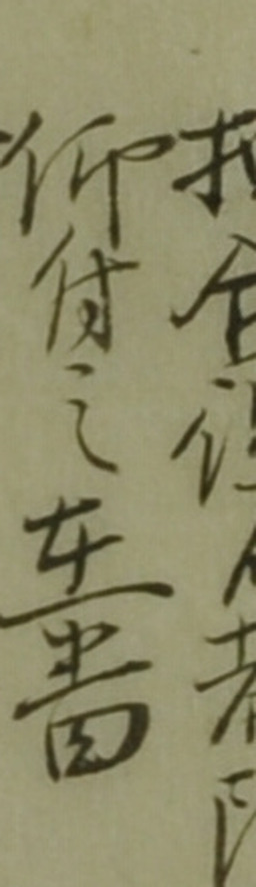仰付之在番
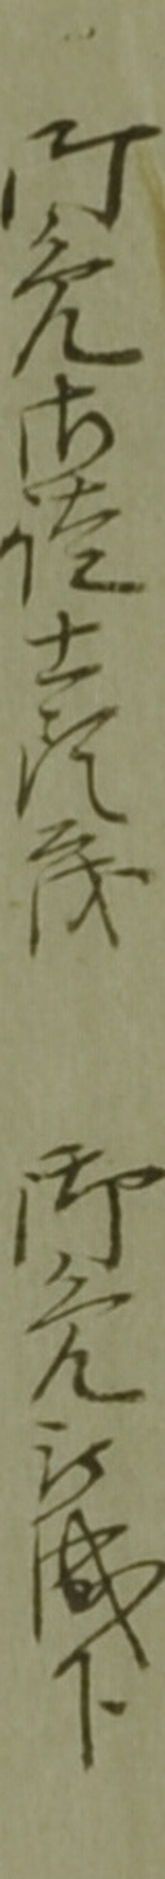御免御徒士頭茂御免被成下
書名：諸御役代々録（七）
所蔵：伊那市立高遠町図書館・合同会社AMANE
